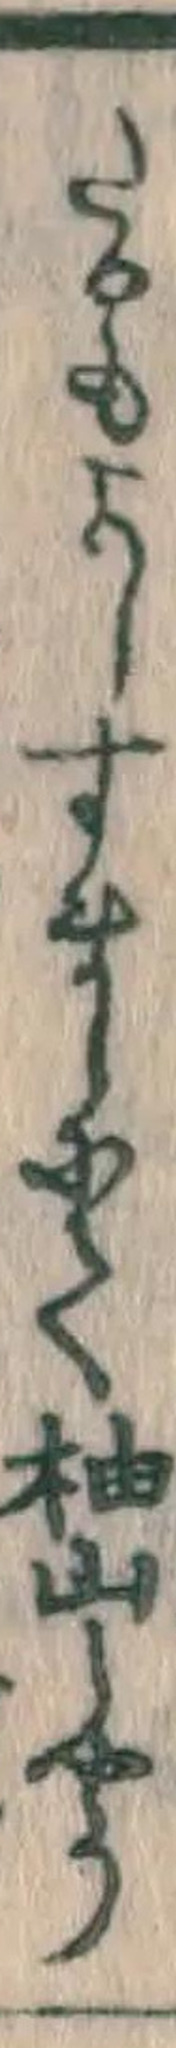たるもよしすましにて柚山しやう
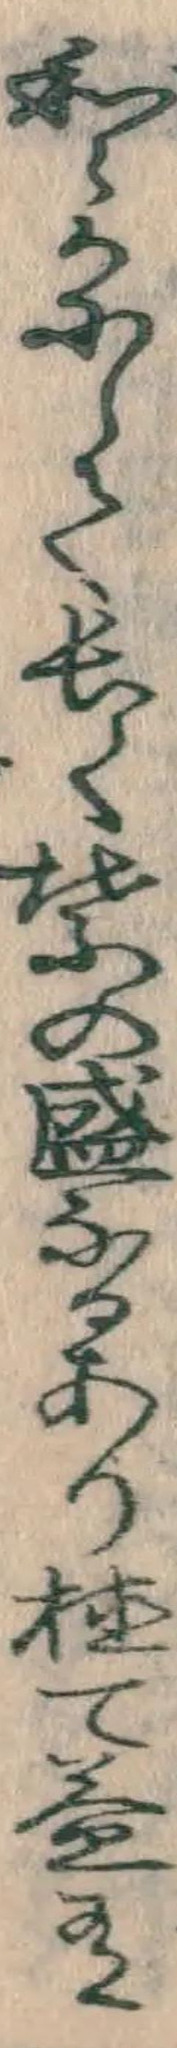和らかにして長く葉の盛なるあり植て益有
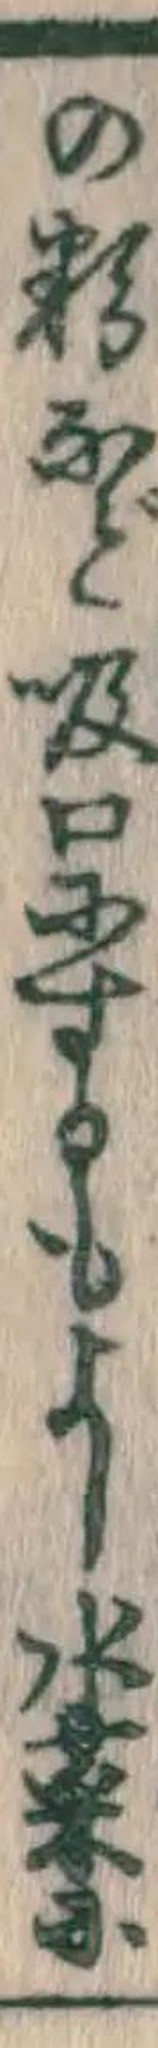の粉など吸にするもよし水菜に
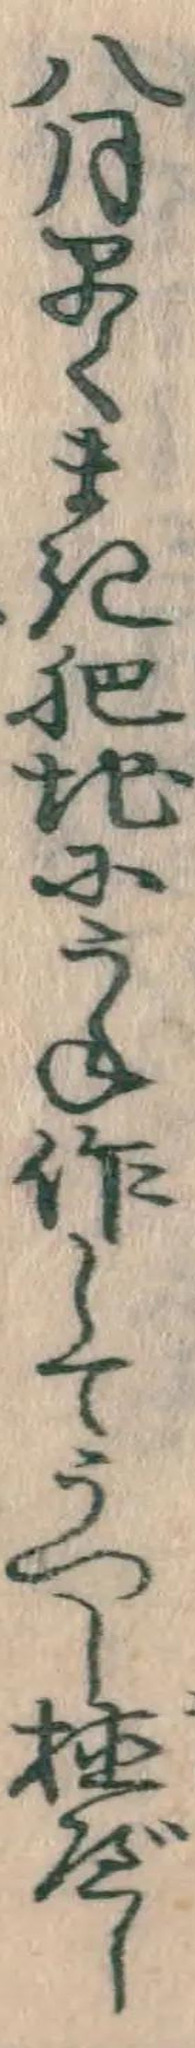八月早くまき肥地にうね作してうつし植べし
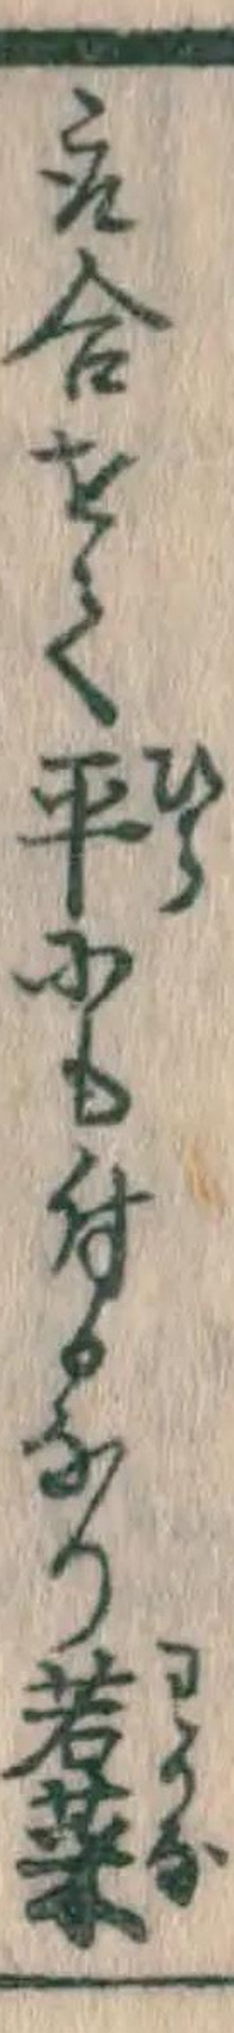取合せて平にも付るなり若菜
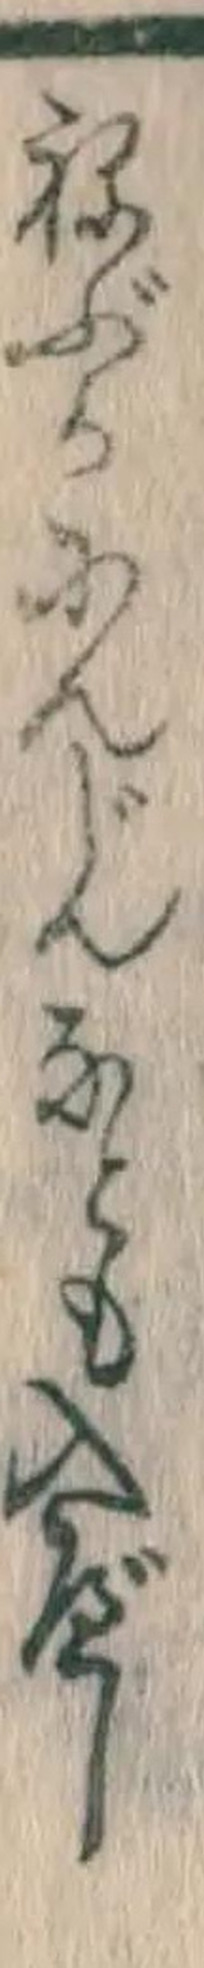ねぶかにんじんなとも入べし
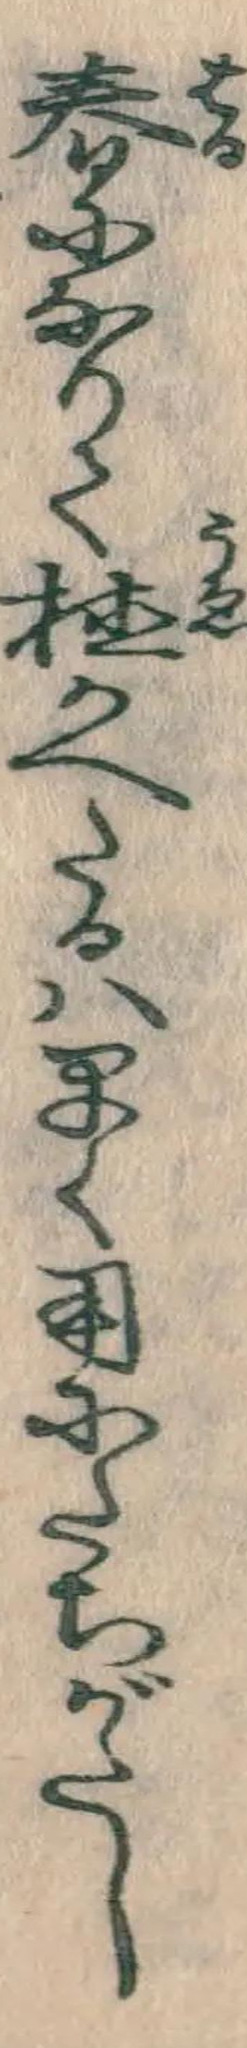春になりて植かへたるは早く用にたちがたし
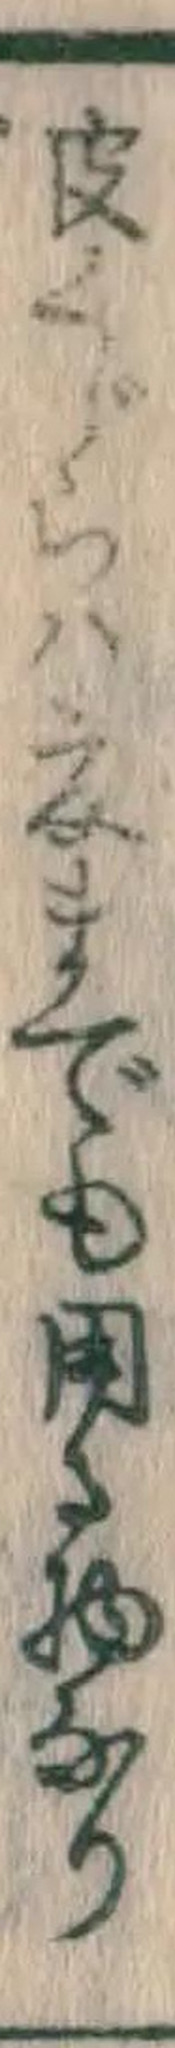皮くじらは夏までも用る物なり
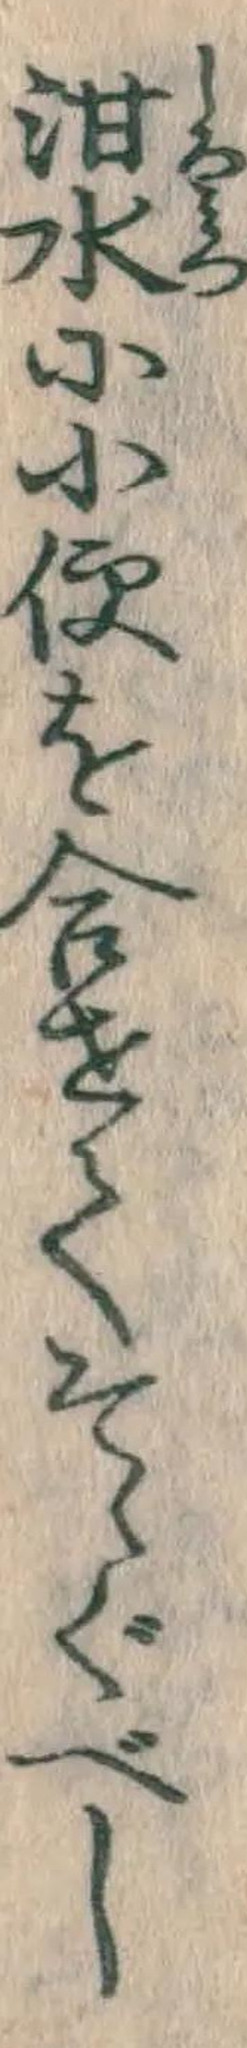泔水に小便を合せてそゝぐべし
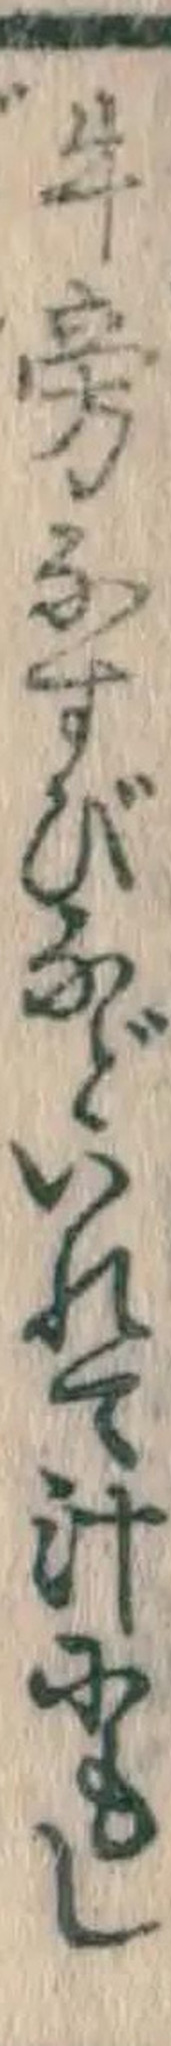牛蒡なすびなどいれて汁にもし
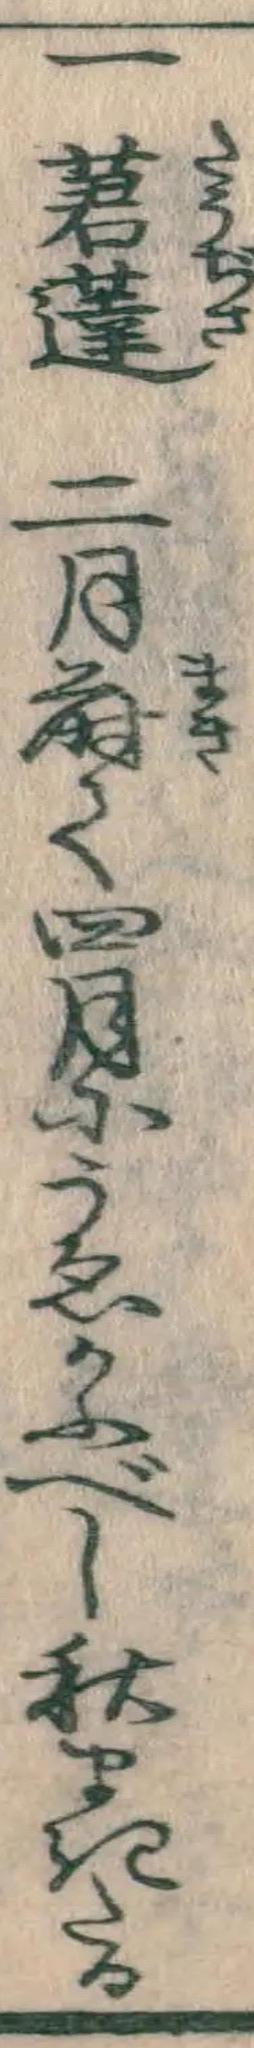一莙薘二月蒔て四月にうゑかふべし秋まきたる
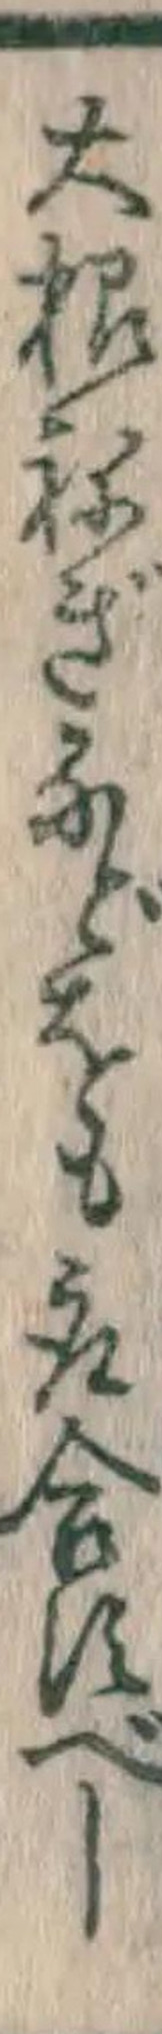大根ねぎなどをも取合すべし
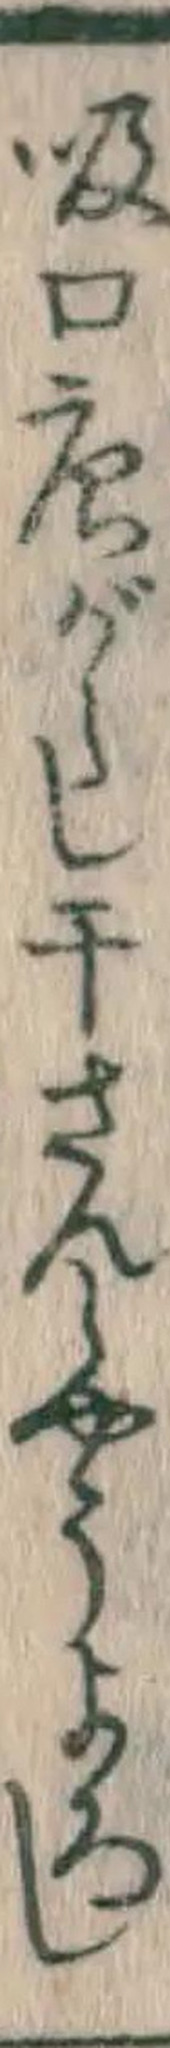吸口唐がらし干さんしやうよろし
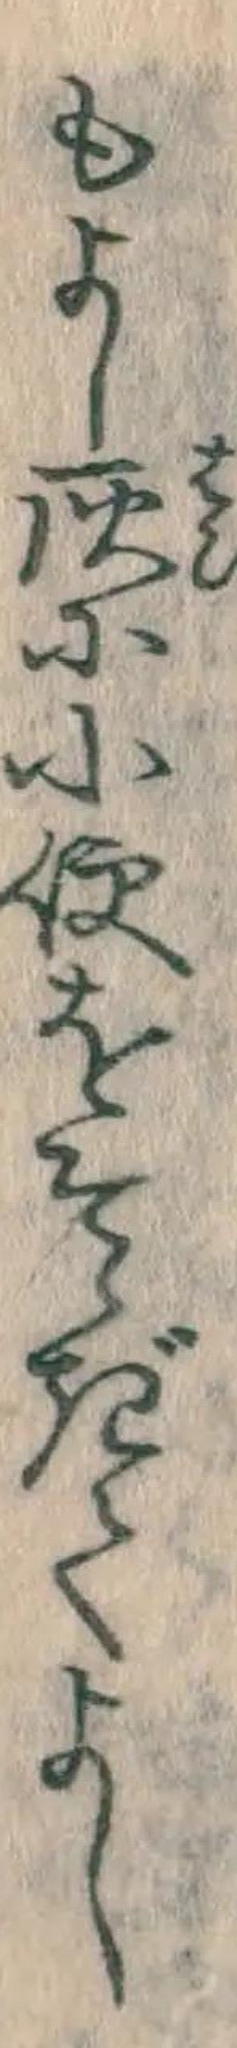もよし灰に小便をそゝぎてよし
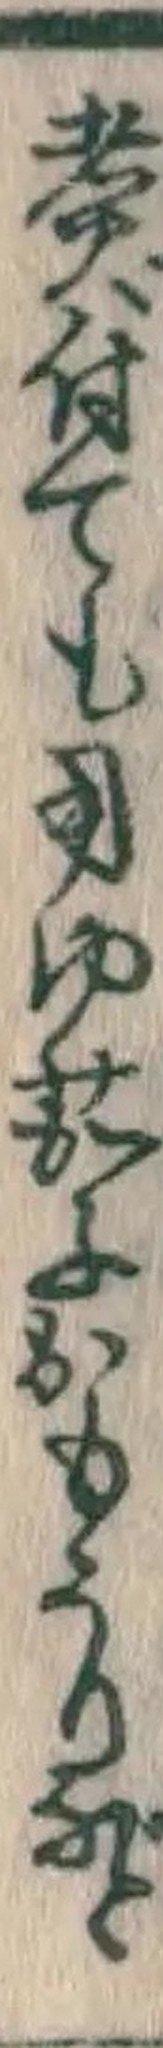煮付ても用ゆ茄子かもうりなど
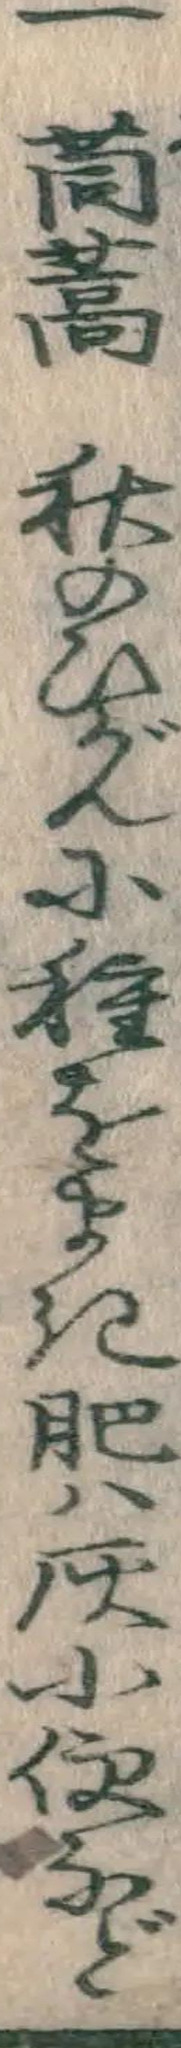一茼蒿秋のひがんに種をまき肥は灰小便など
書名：広益秘事大全 3巻. [5]
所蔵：国立国会図書館 National Diet Library, JAPAN
